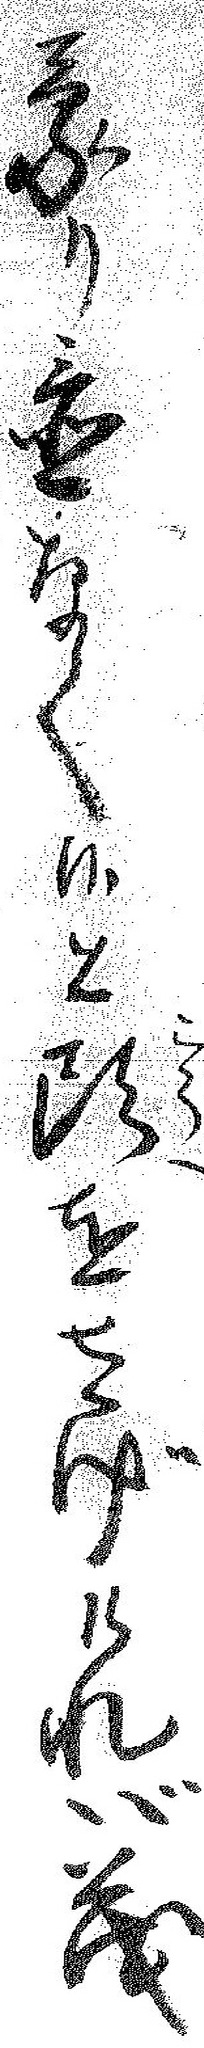蒙り置なく候と頭をさげければ茂
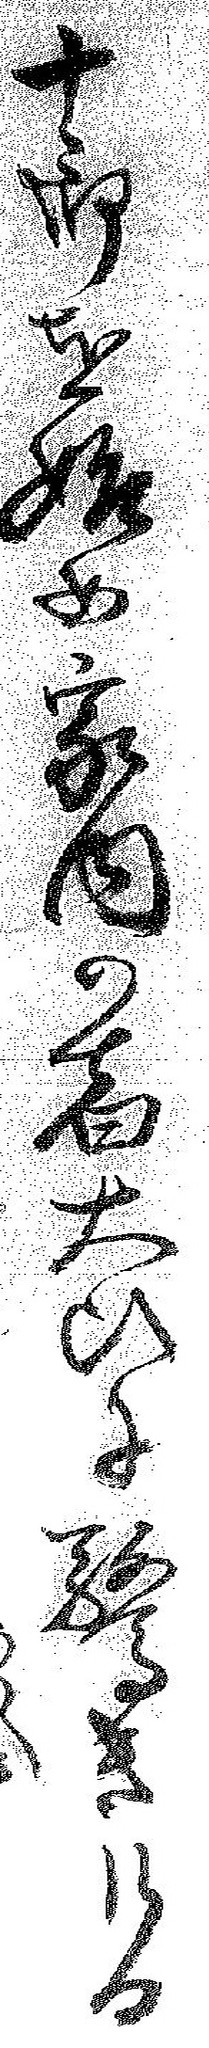十郎を始め家内の者大ひに驚きける
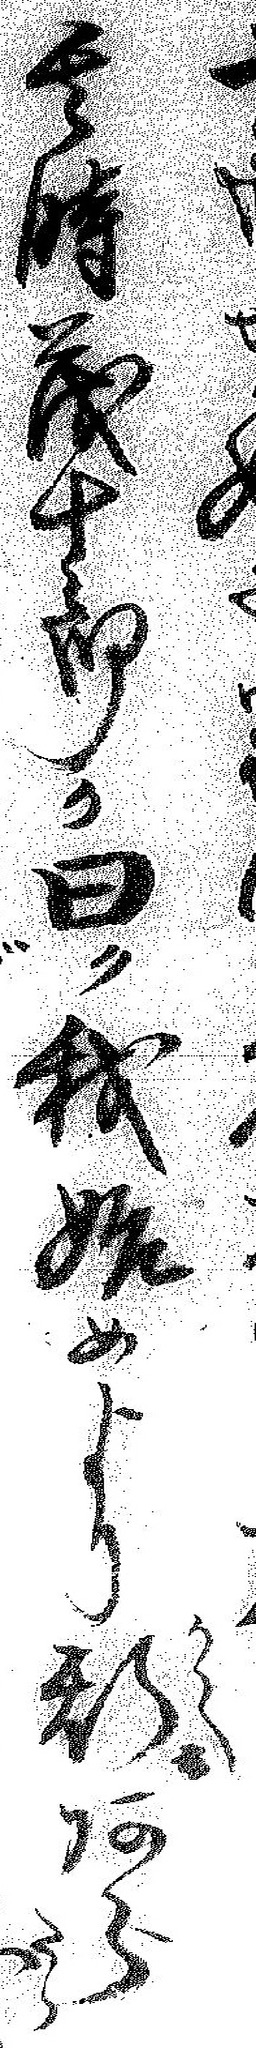其時茂十郎か曰く我始めより斯あら
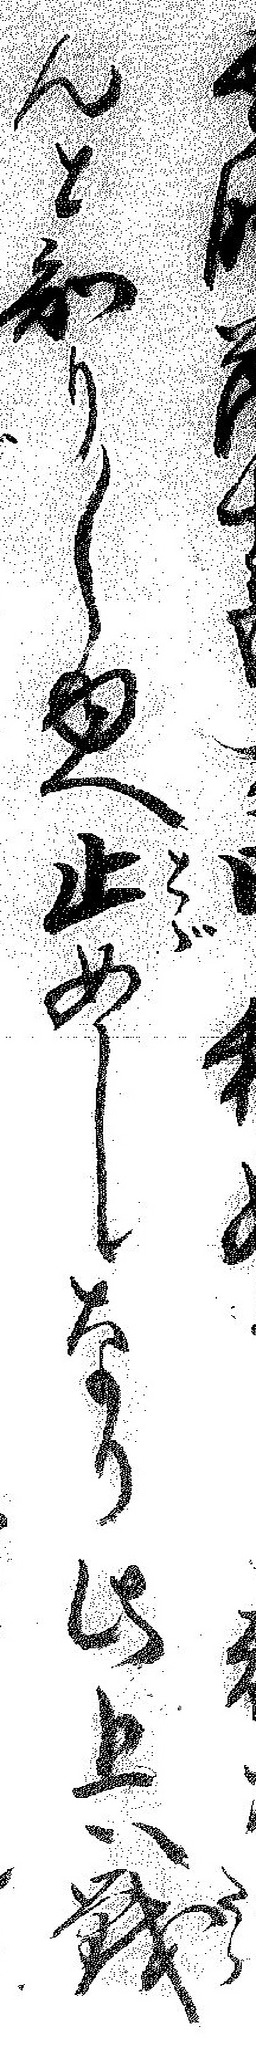んと知りしゆえ止めしなり此上は戦
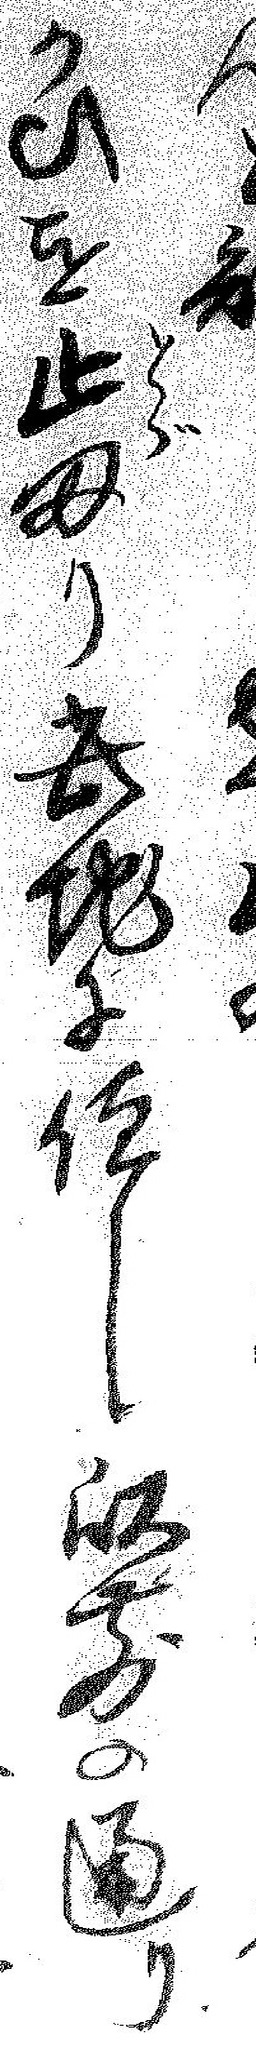かひを止まり此地に住し以前の通り
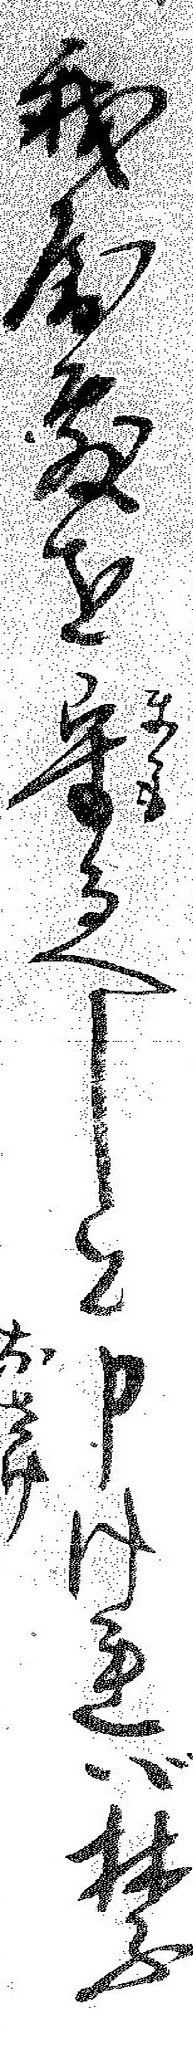我属敷を守るへしと申ければ禁
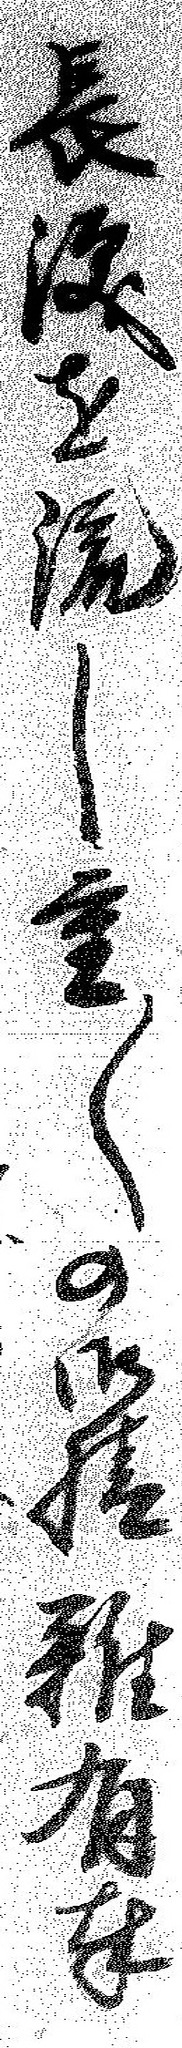長涙を流し重〳〵の御情難有奉
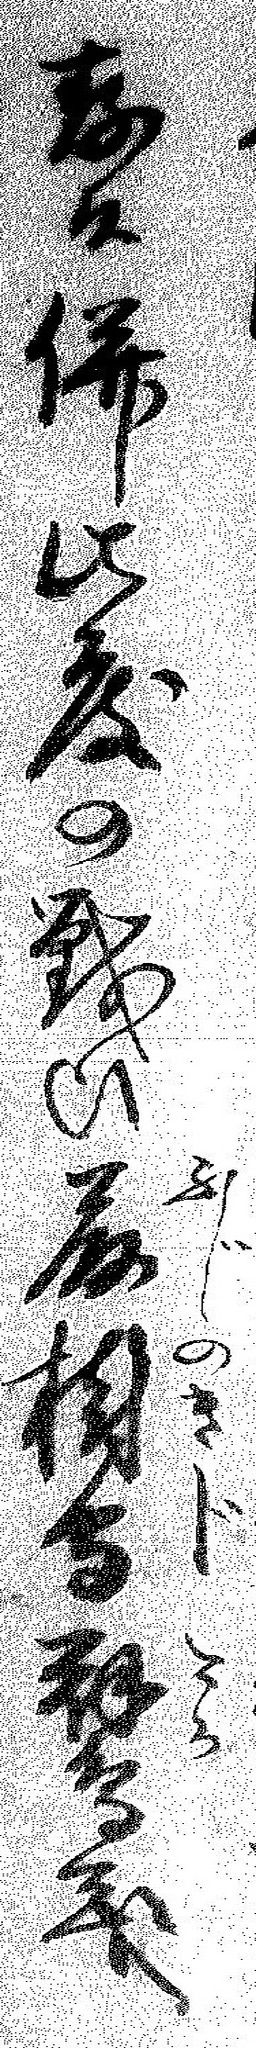存候併此度の戦ひ藤樹寺鷹義

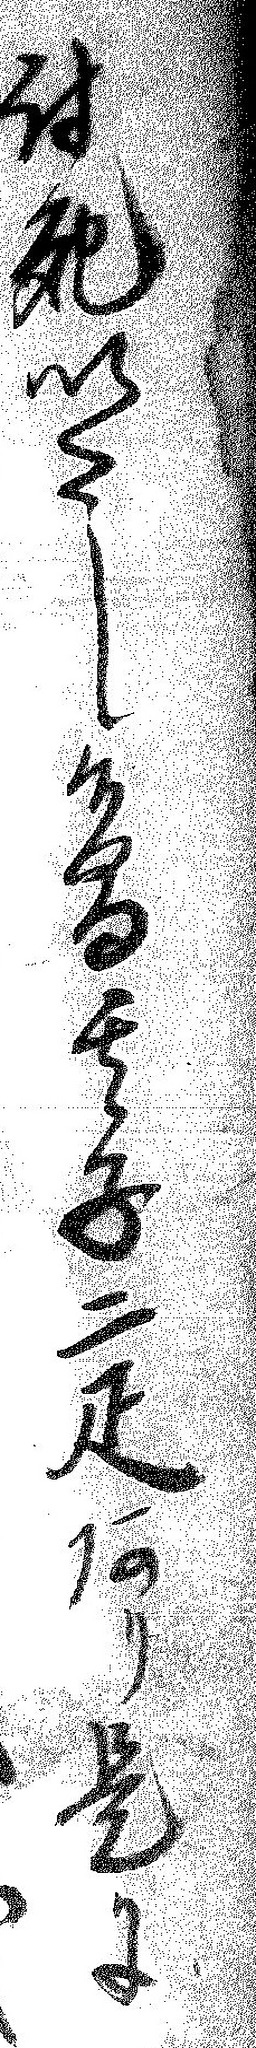討死いたし候間其子二疋あり是に
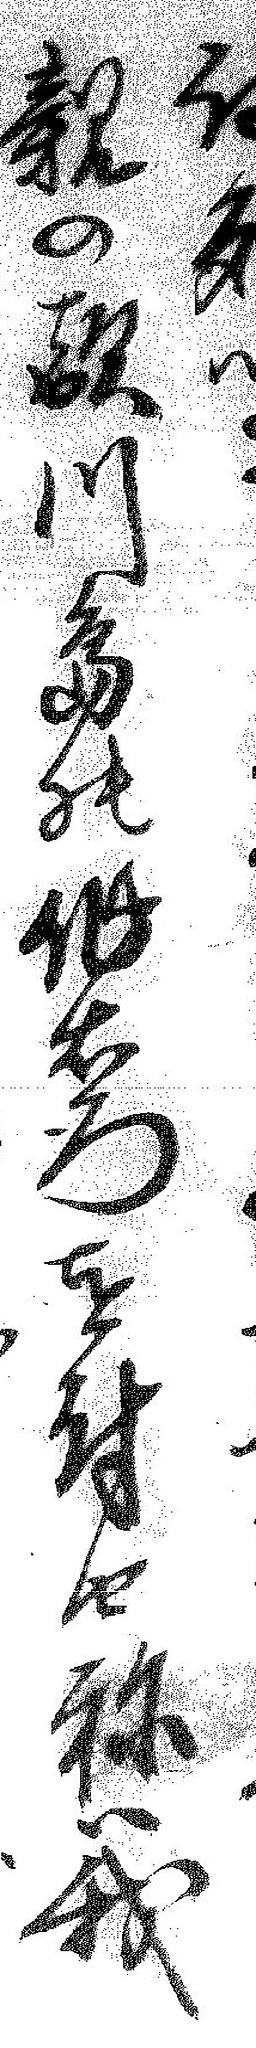親の敵川島の作右衛門を討せねは我
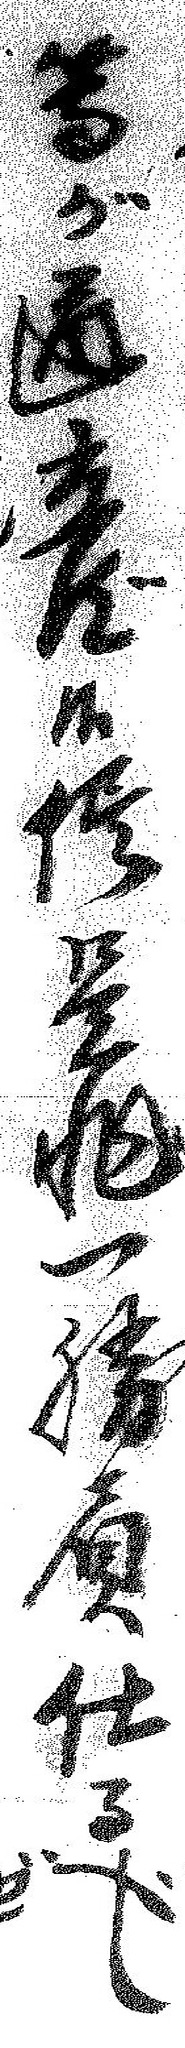等が道立ず候侭是非一勝負仕るべし
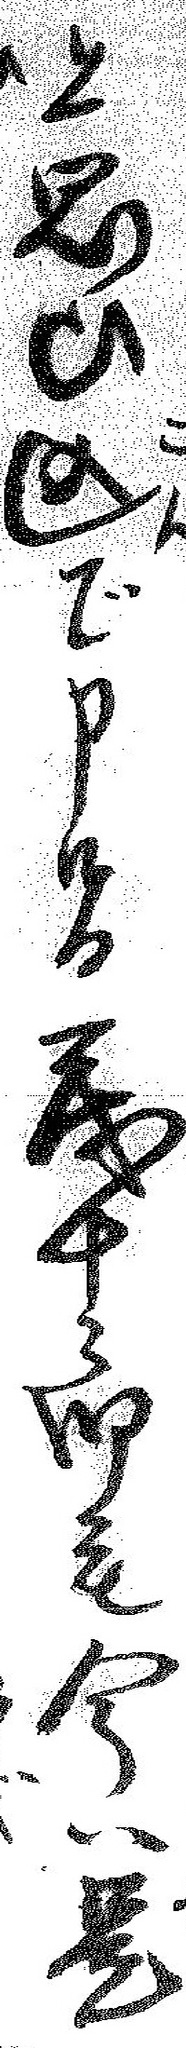と思ひ込で申ける茂十郎も今は是
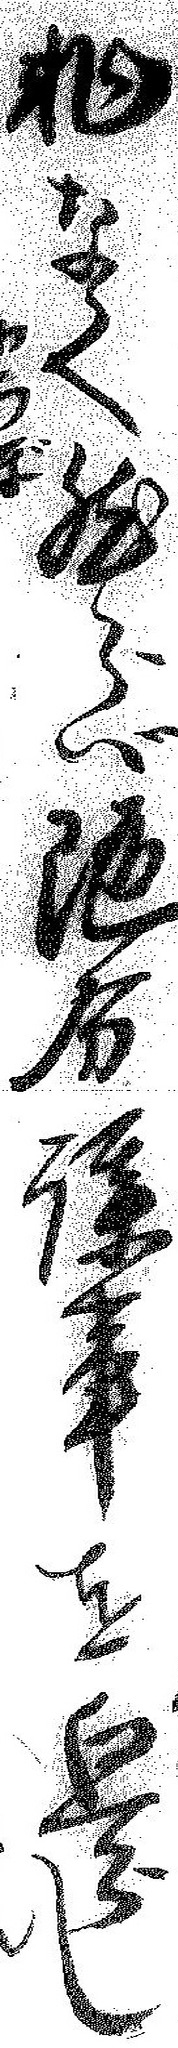非なく然らば随分謀事を廻らし
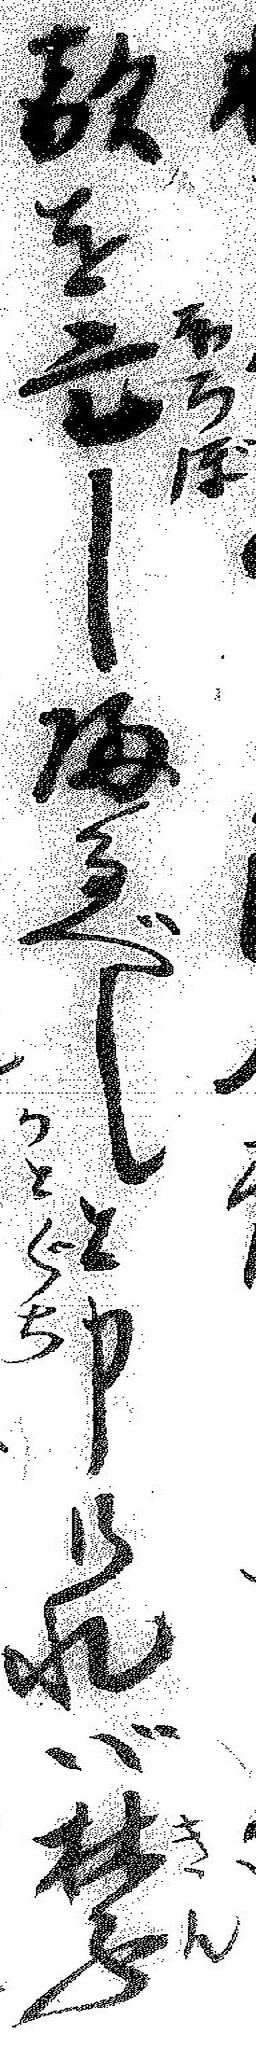敵を亡し帰るべしと申ければ禁
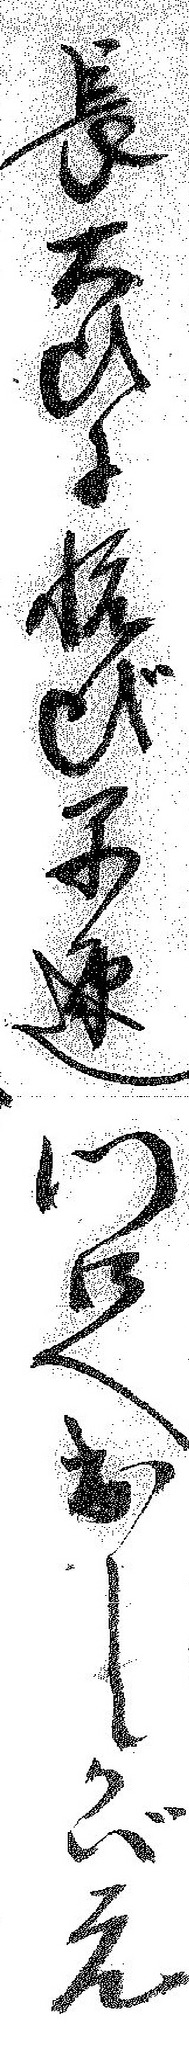長大ひに悦び早速門口へ出しかば元
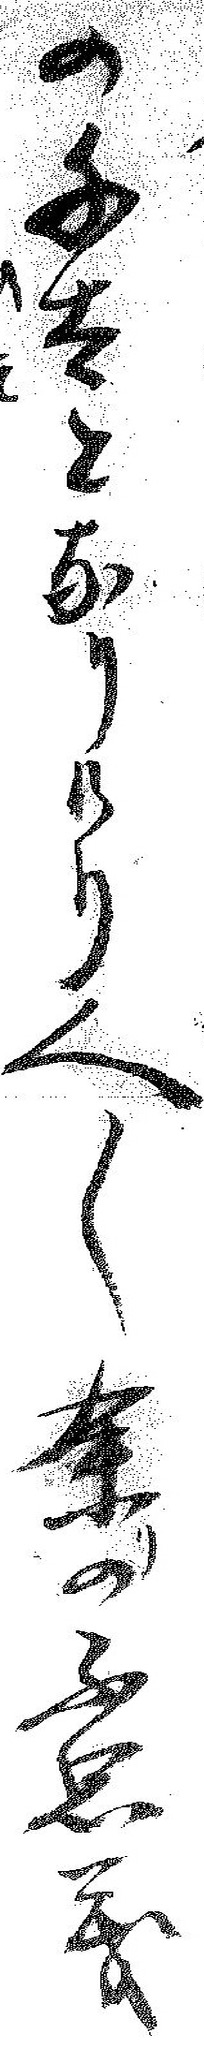の千太となりけり人〳〵余りの不思義
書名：近頃古狸珍説　礼義智信
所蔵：徳島県立図書館
